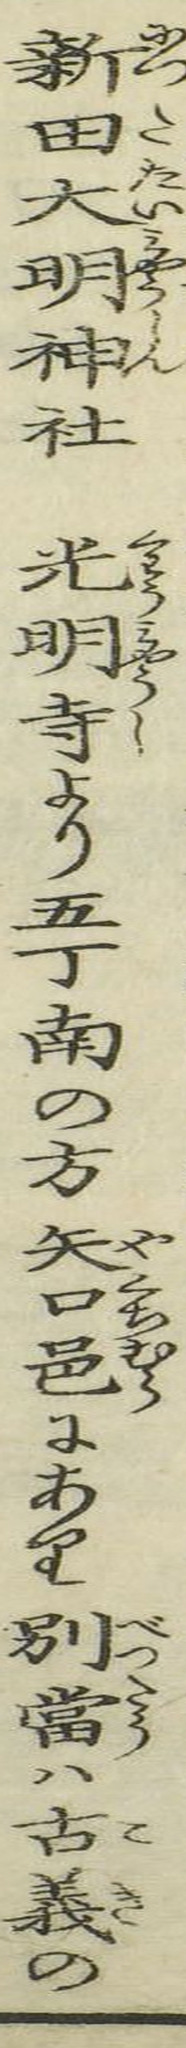新田大明神社光明寺より五丁南の方矢口邑にあり別當は古義の
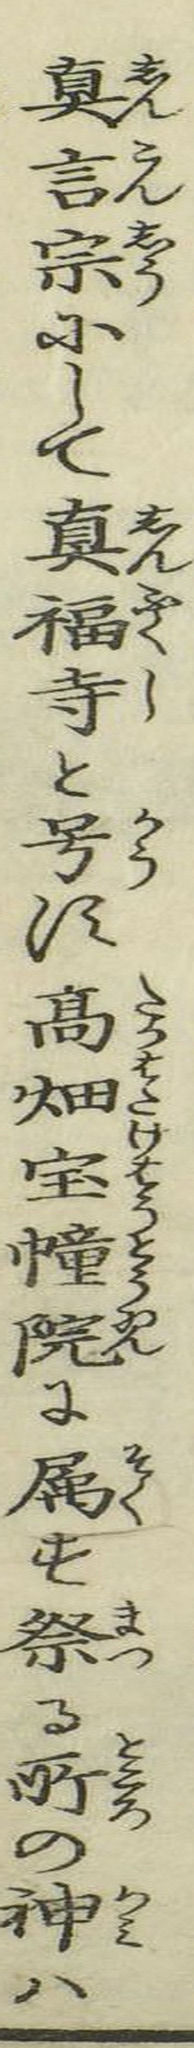真言宗にして真福寺と号す髙畑宝幢院に属す祭る所の神は
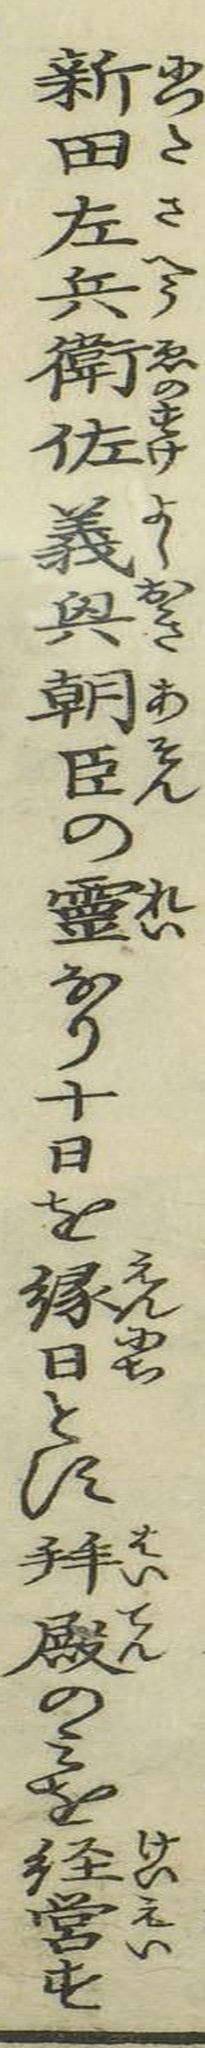新田左兵衛佐義興朝臣の靈なり十日を縁日とす拜殿のみを経営す

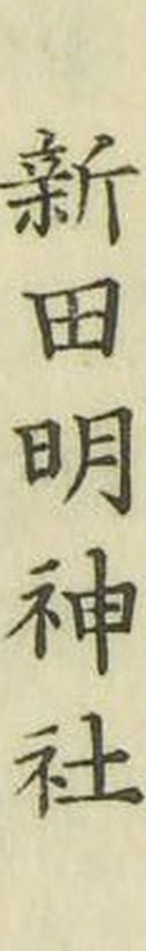新田明神社
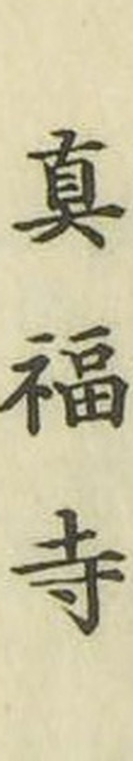真福寺

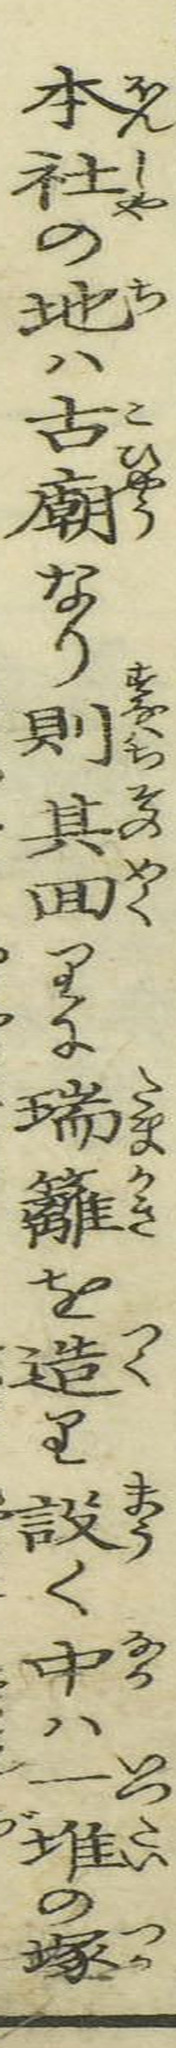本社の地は古廟なり則其回りに瑞籬を造り設く中は一堆の塚
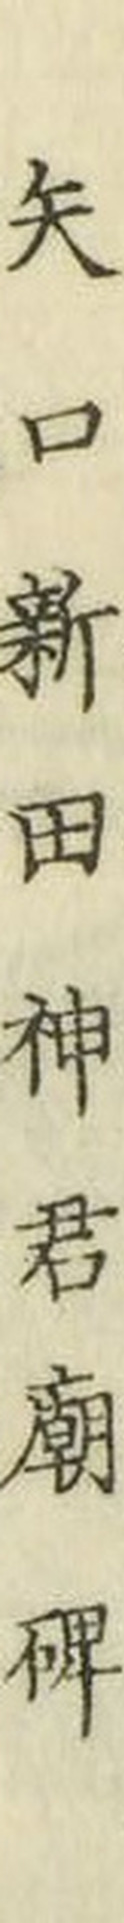矢口新田神君廟碑
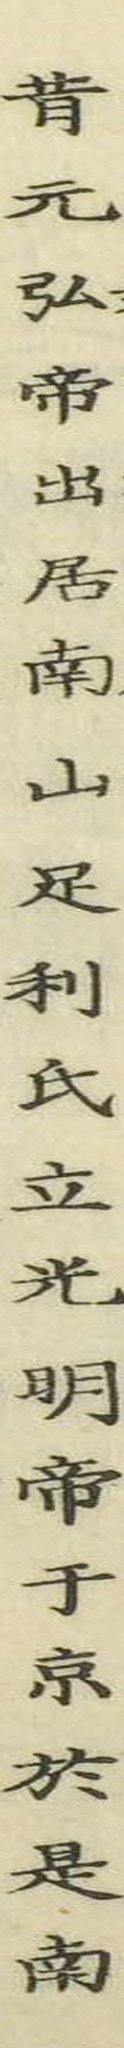昔元弘帝出居南山足利氏立光明帝于京於是南
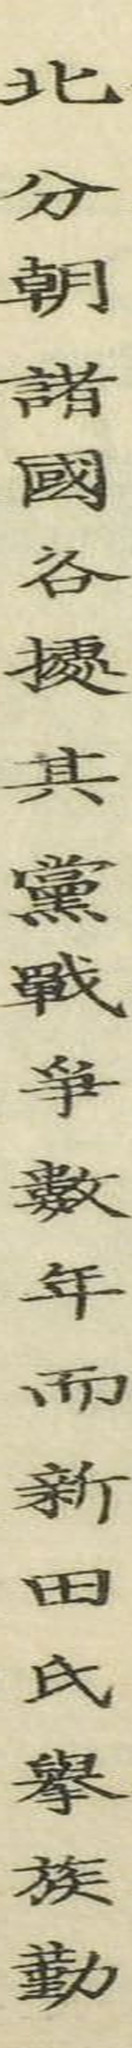北分朝諸國各㨿其黨戰爭數年而新田氏擧族勤
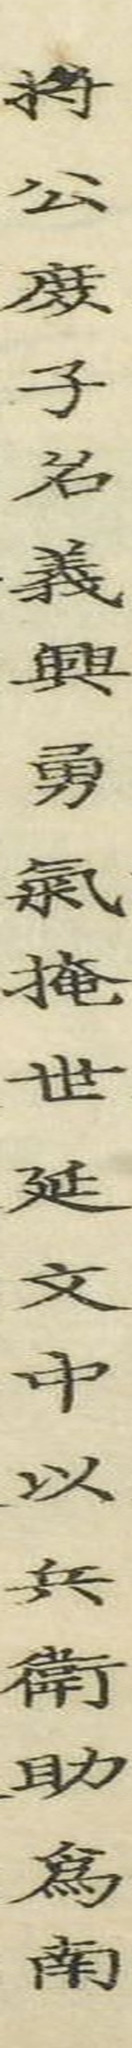將公庶子名義興勇氣掩世延文中以兵衛助爲南
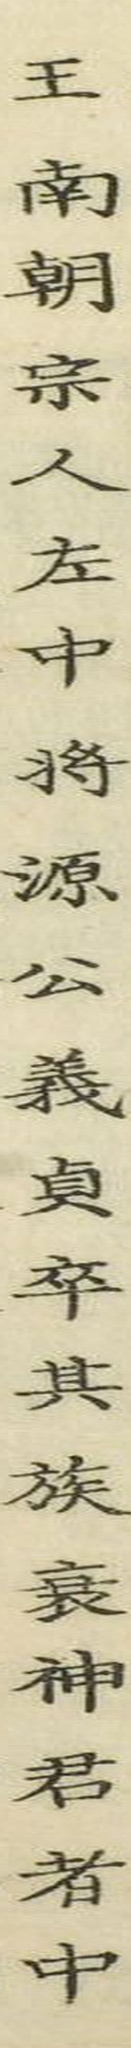王南朝宗人左中將源公義貞卒其族衰神君者中
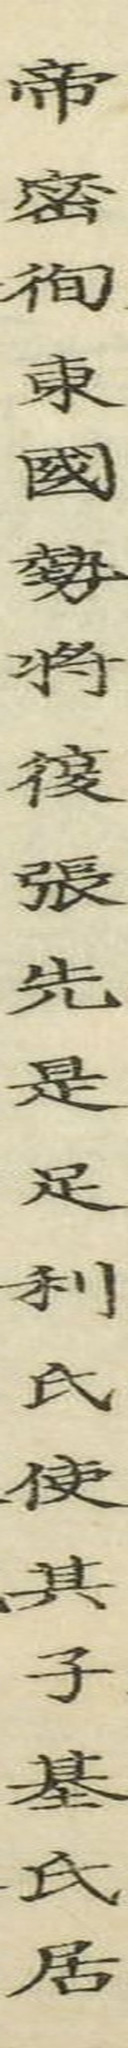帝密徇東國勢將復張先是足利氏使其子基氏居
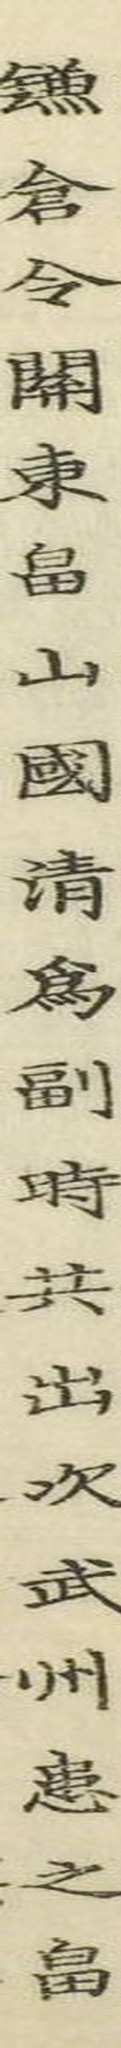鎌倉令關東畠山國清爲副時共出次武州患之畠
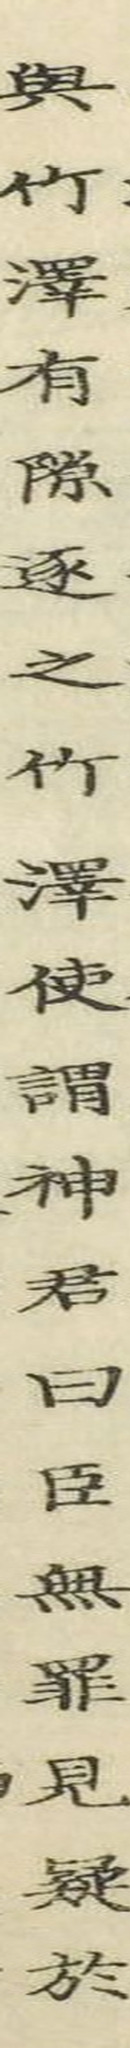與竹澤有隙逐之竹澤使謂神君曰臣無罪見疑於
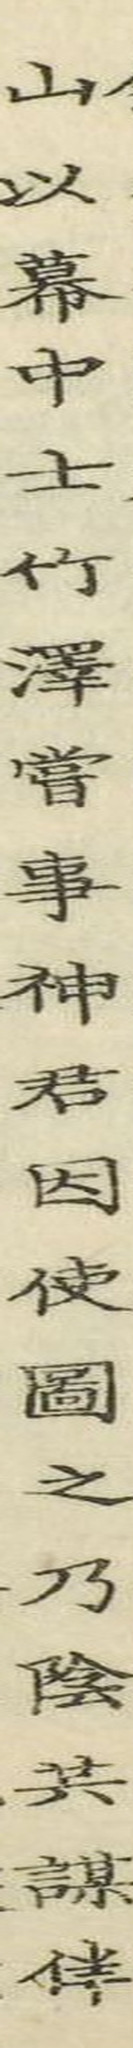山以幕中士竹澤嘗事神君因使圖之乃陰共謀伴
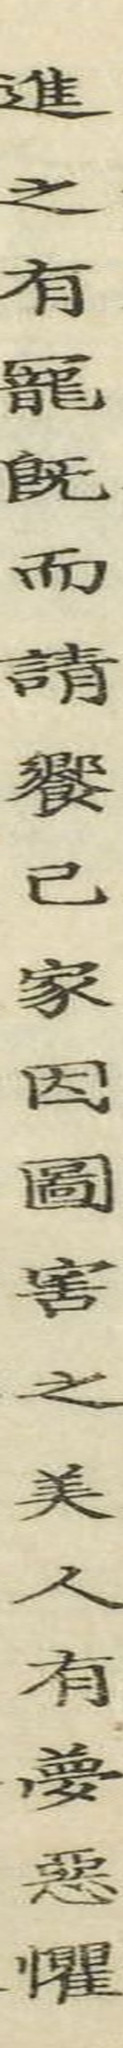進之有寵既而請饗己家因圖害之美人有夢惡懼
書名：江戸名所図会 20巻 巻之4
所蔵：東京学芸大学教育コンテンツアーカイブ
